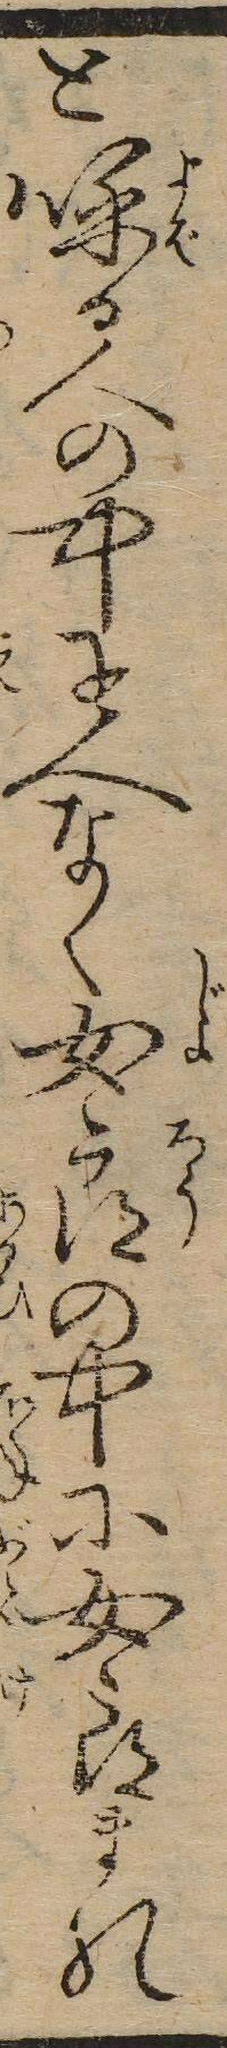と呼る人の中に人なく女郎の中に女郎まれ
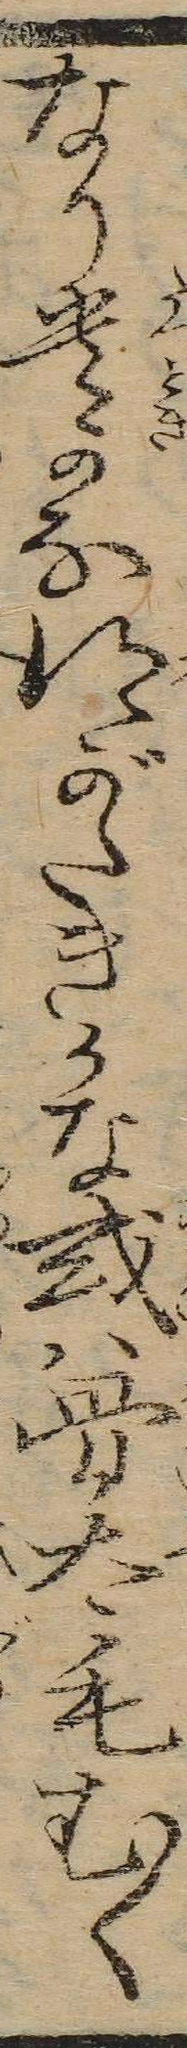なり貴かな得がたきかな或は骨太毛むく
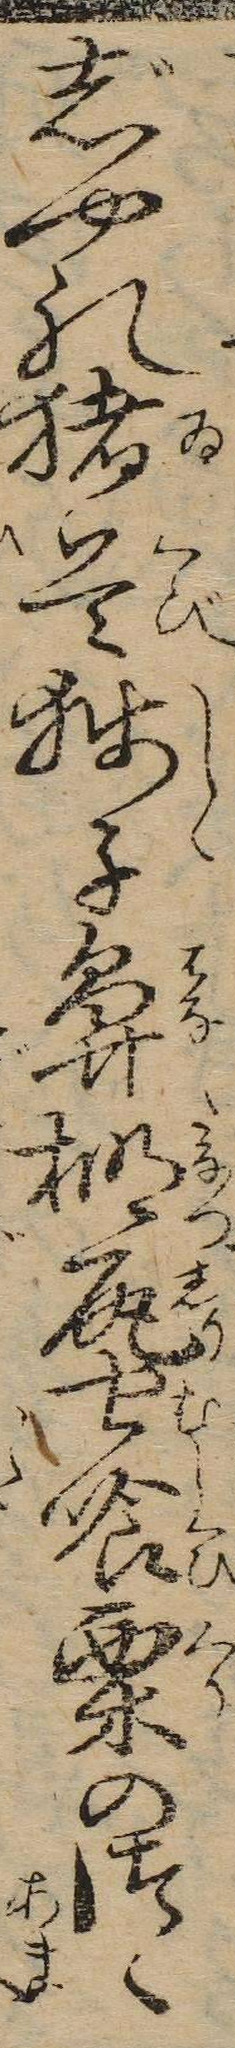じやれ猪首獅子鼻棚尻虫喰栗のつゝ
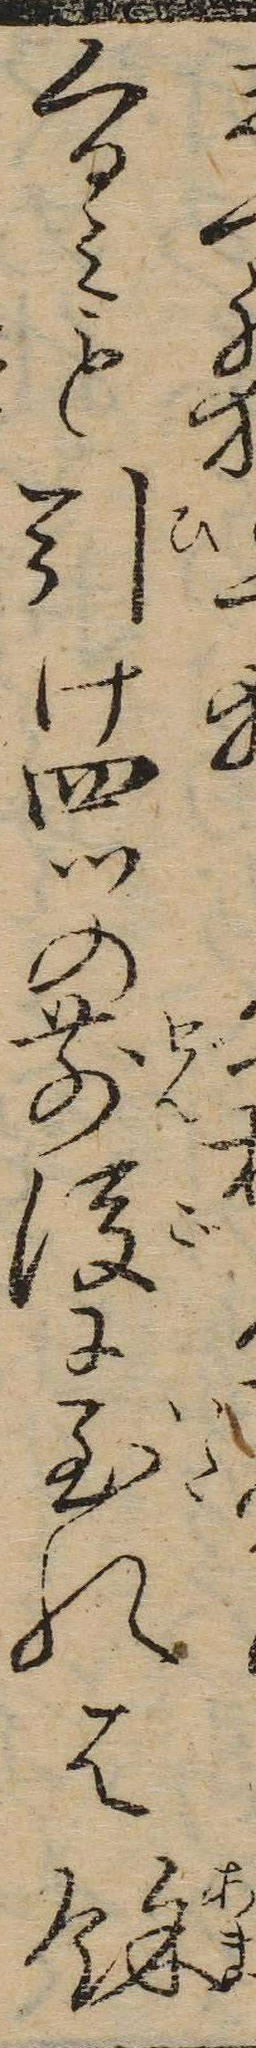くるみも引け四ツの前後に至れは余
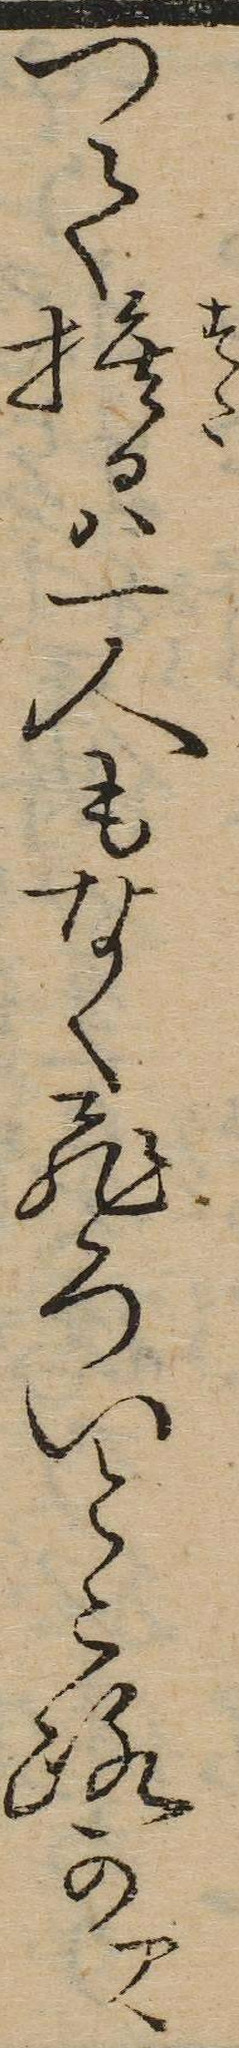つて捨るは一人もなくひろいところかァゝ
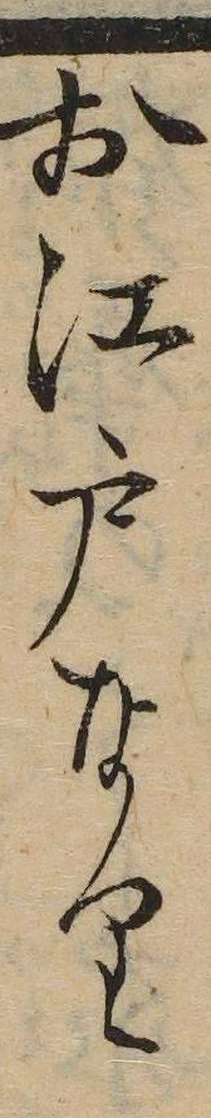お江戸なり
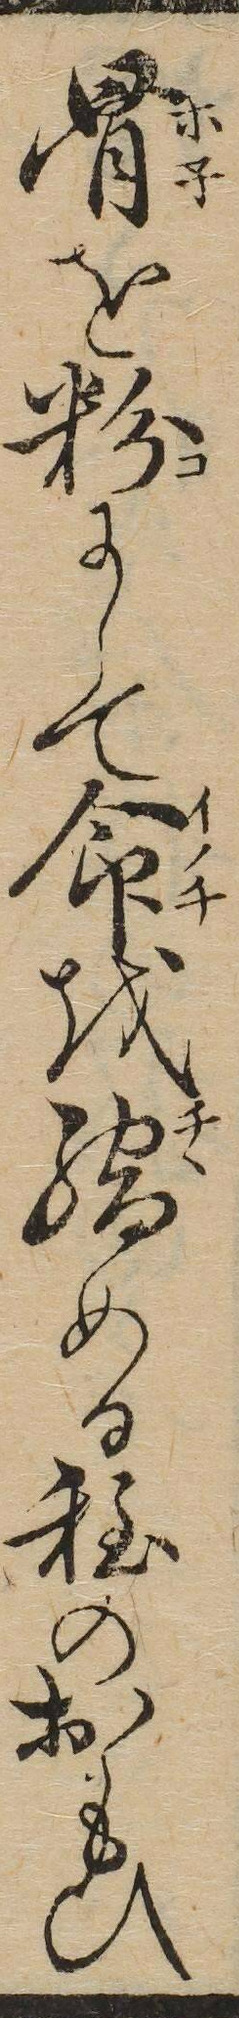骨を粉にして命を縮める程のおもひ
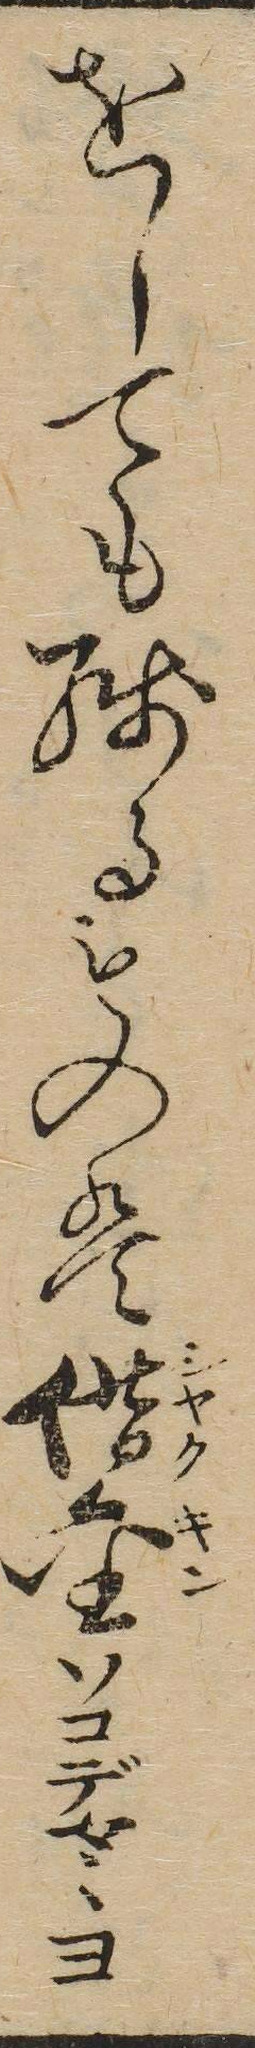をしても残るものは借金ソコデマゝヨ
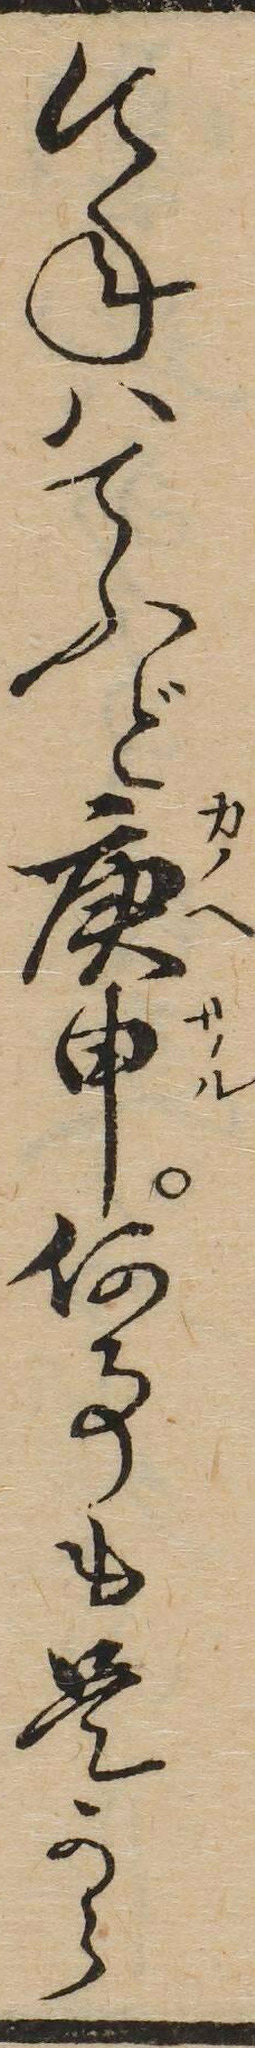今年はてふど庚申。何事も是から
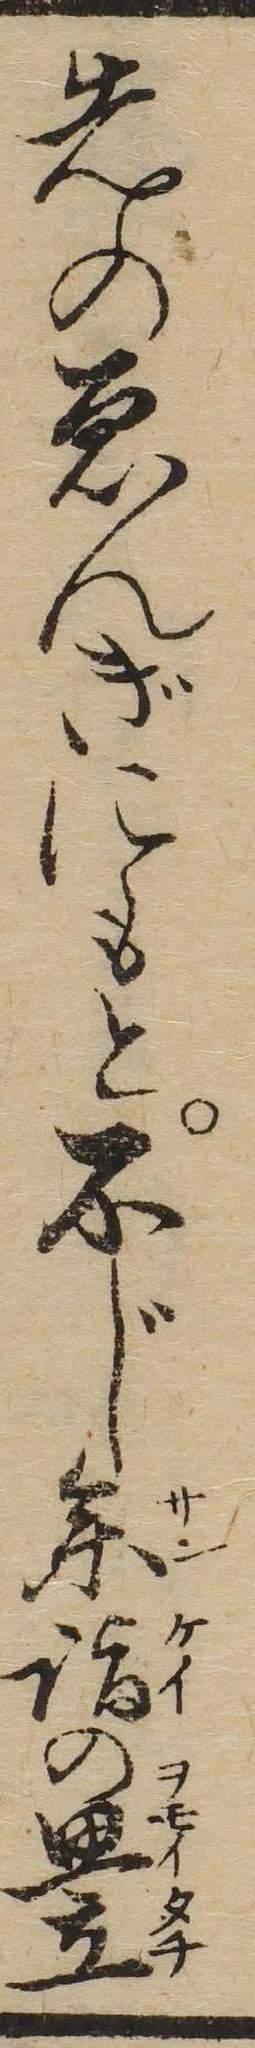先のゑんぎにもと。ふじ参詣の思立
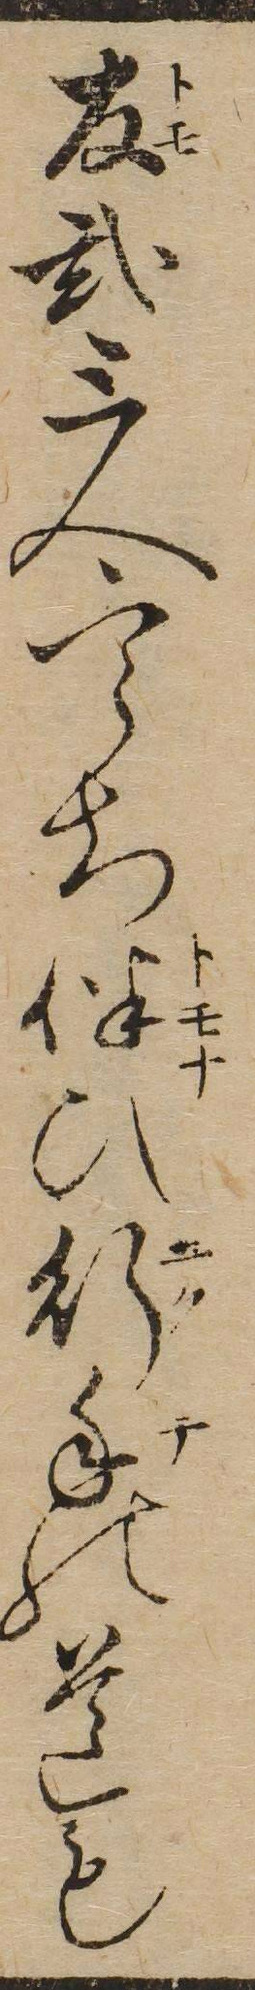友弐三人うち伴ひ行手の道も

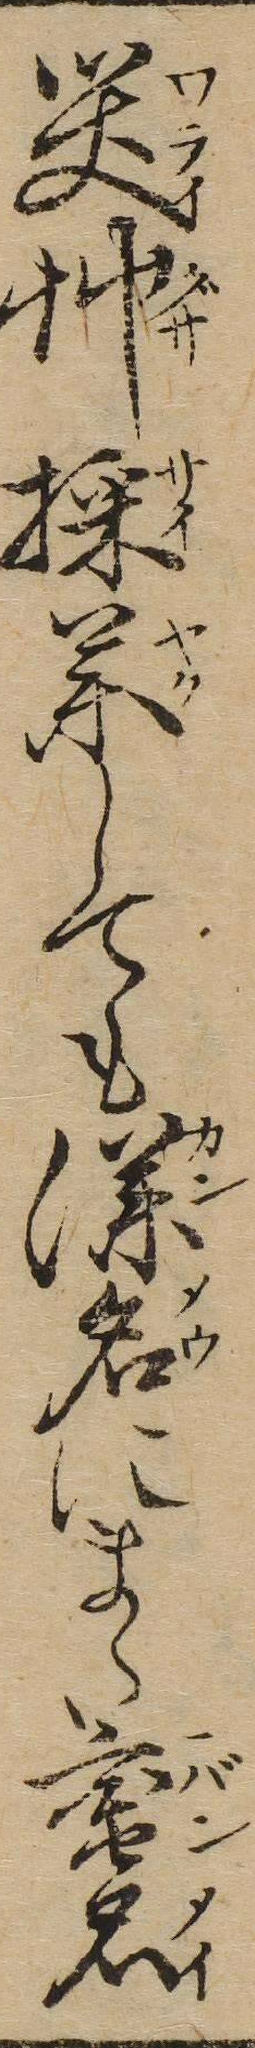笑草採薬しても漢名にまた蛮名
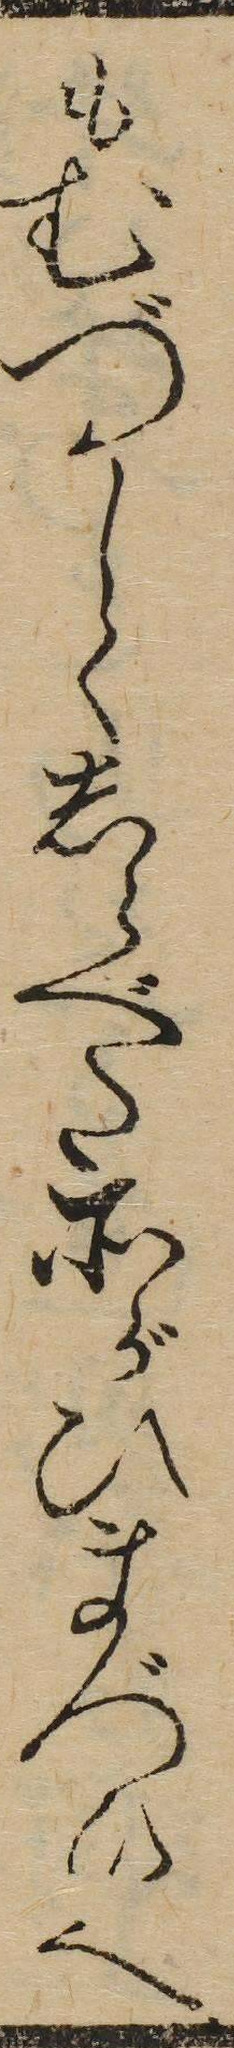もむづかしくしらべた所がひまづひへ
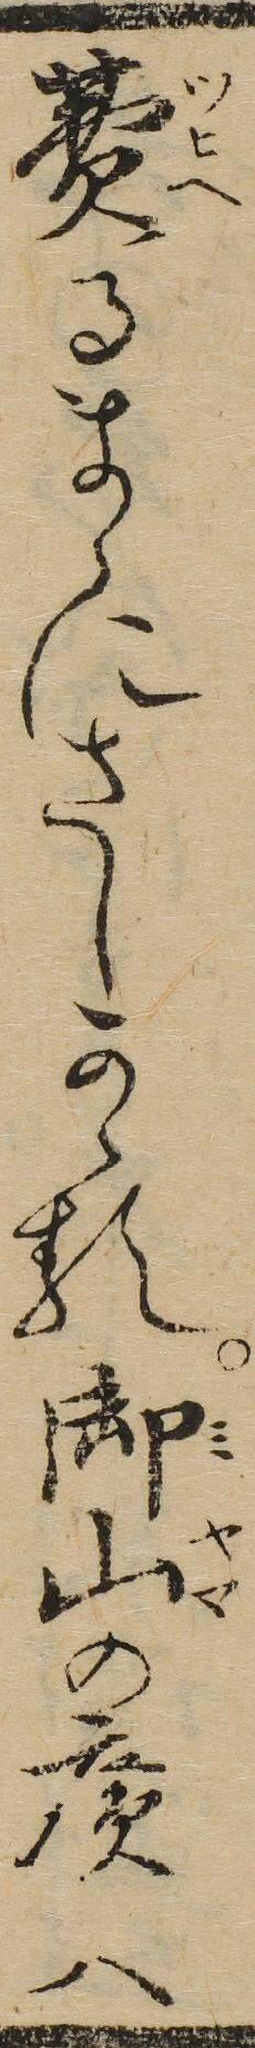費るまゝにさしかゝる。御山の広は
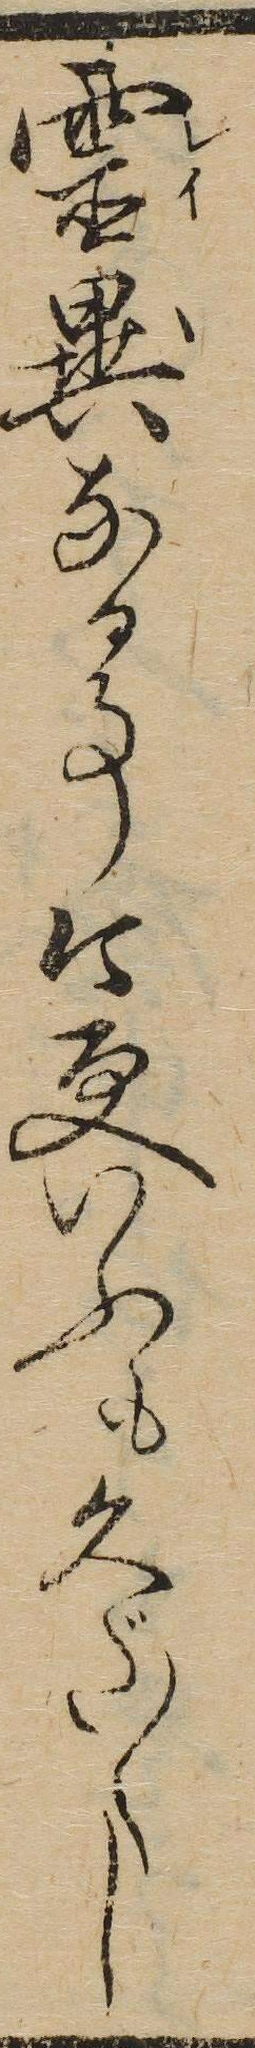霊異なる事今更いふもくだ〳〵し
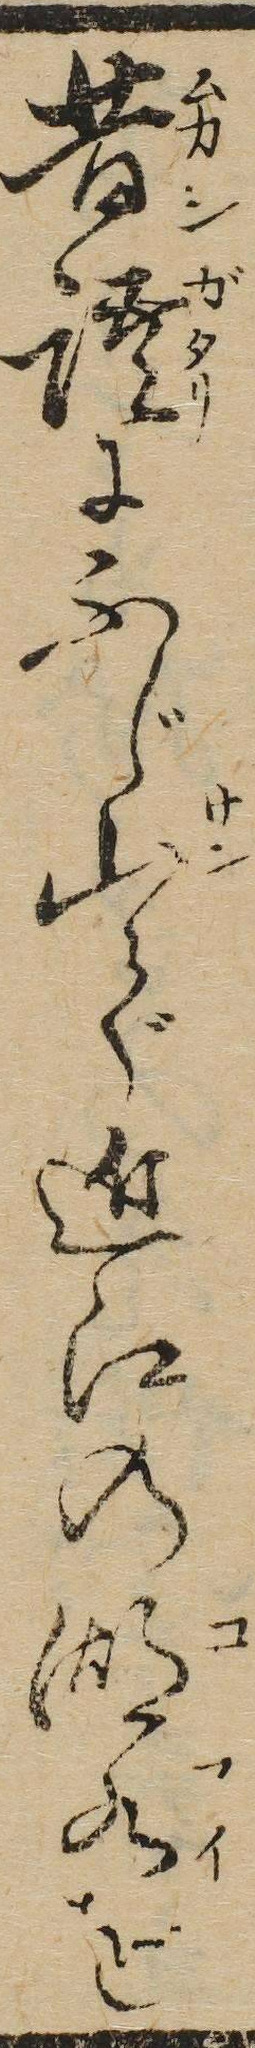昔語にふじ山で近江の湖水を
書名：細見嗚呼御江戸
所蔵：国文学研究資料館
